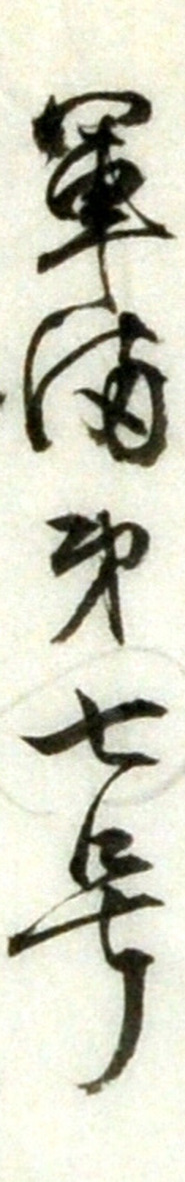軍備第七号
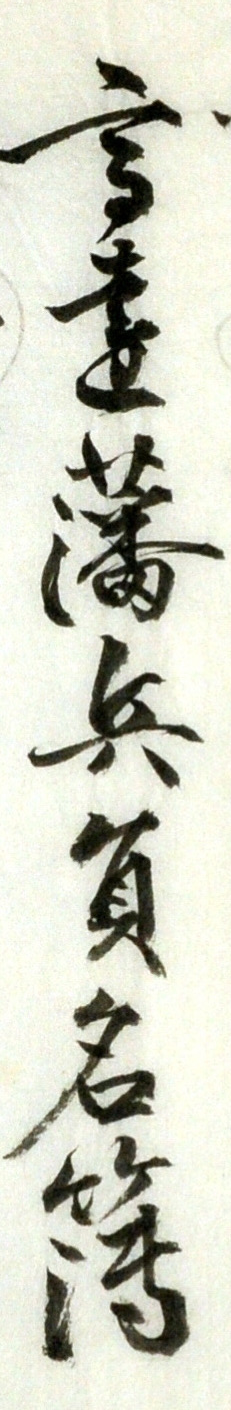高遠藩兵員名簿
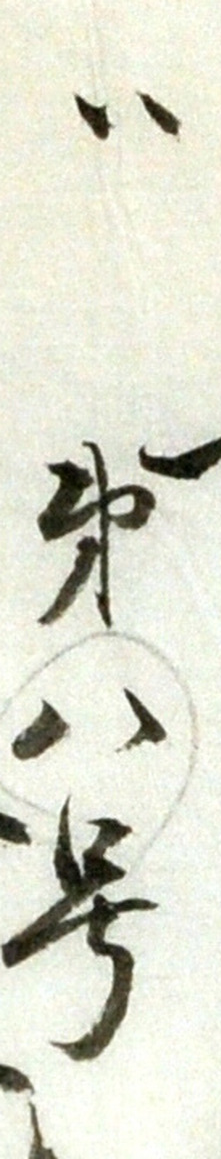〃第八号
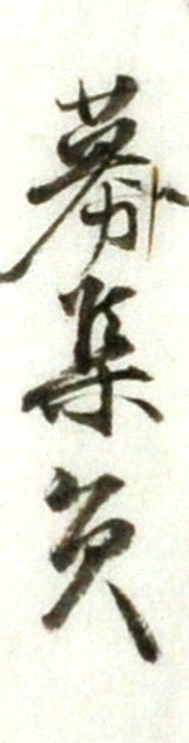募集員
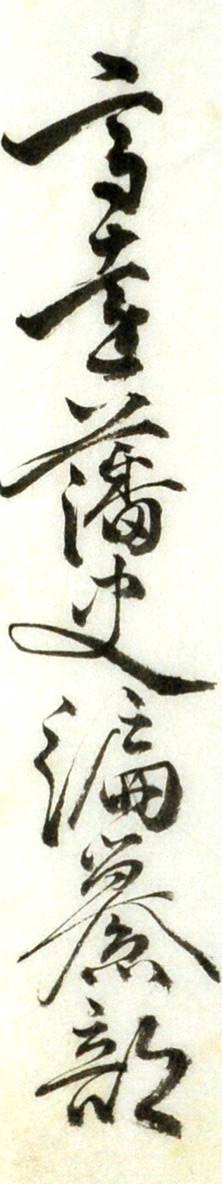高遠藩史編纂部

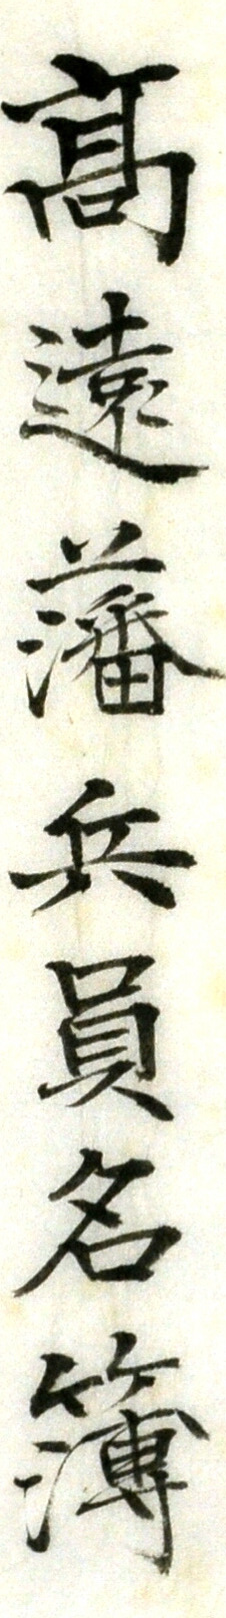高遠藩兵員名簿

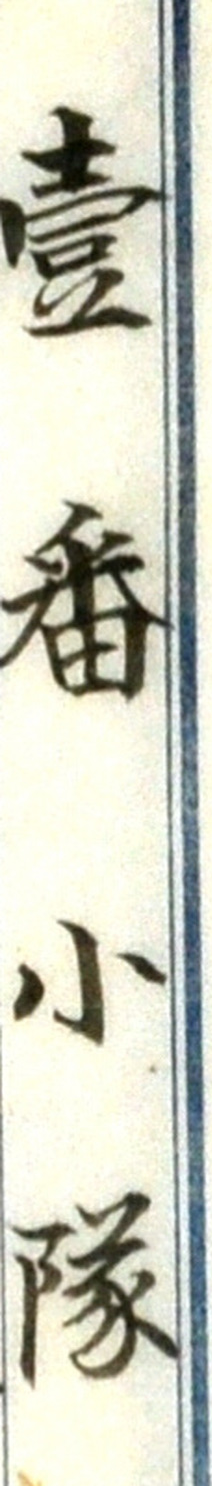壱番小隊
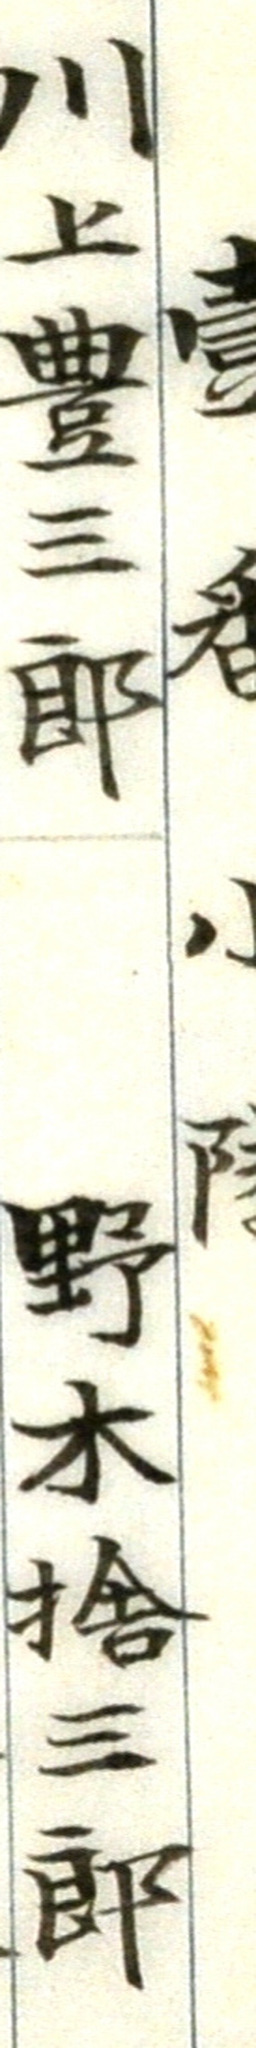川上豊三郎野木捨三郎
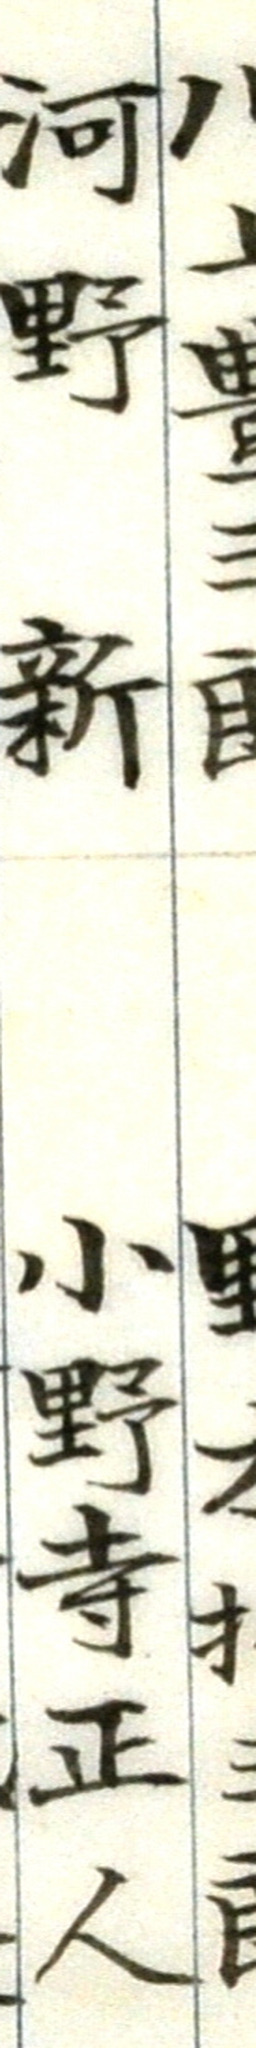河野新小野寺正人
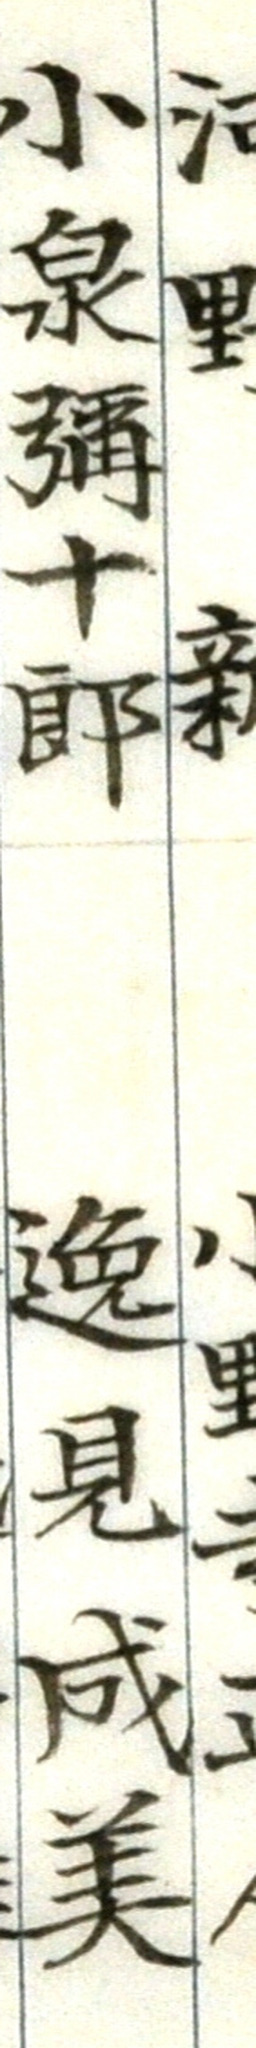小泉弥十郎逸見成美
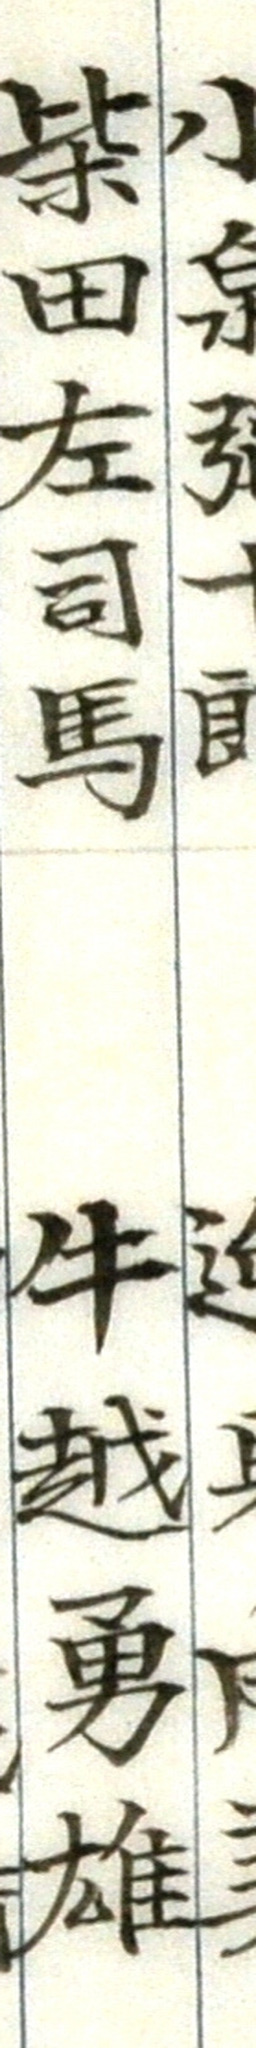柴田左司馬牛越勇雄
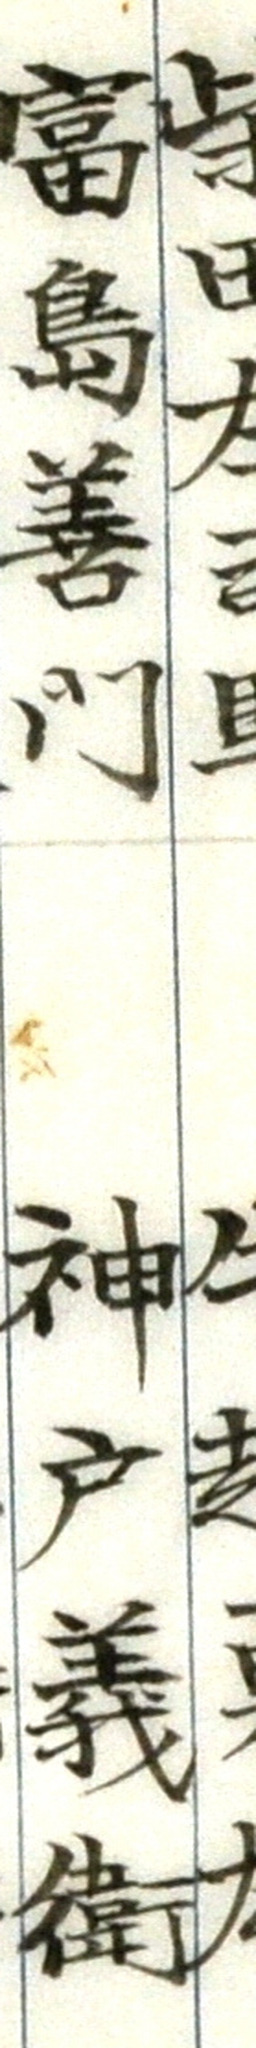富島善門神戸義衛
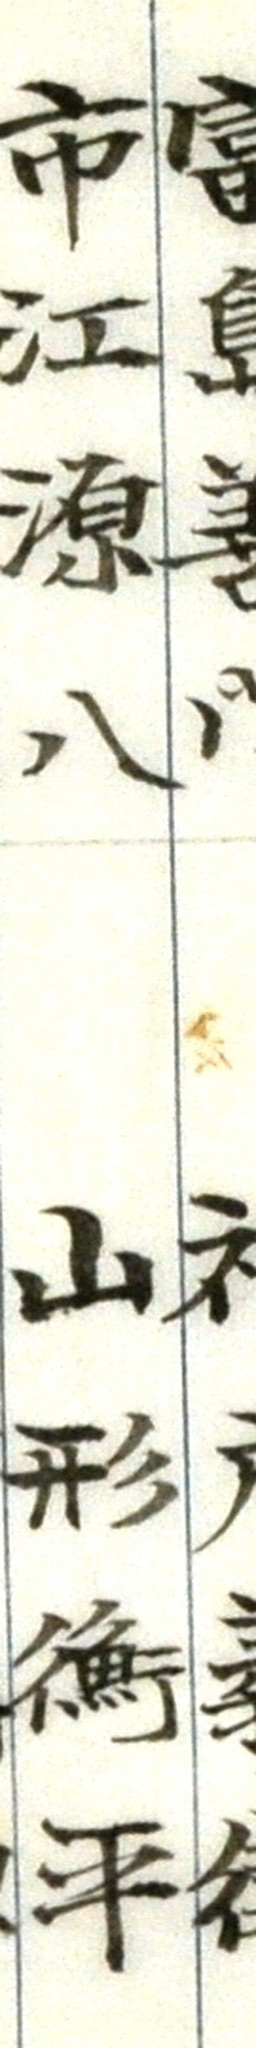市江源八山形衡平
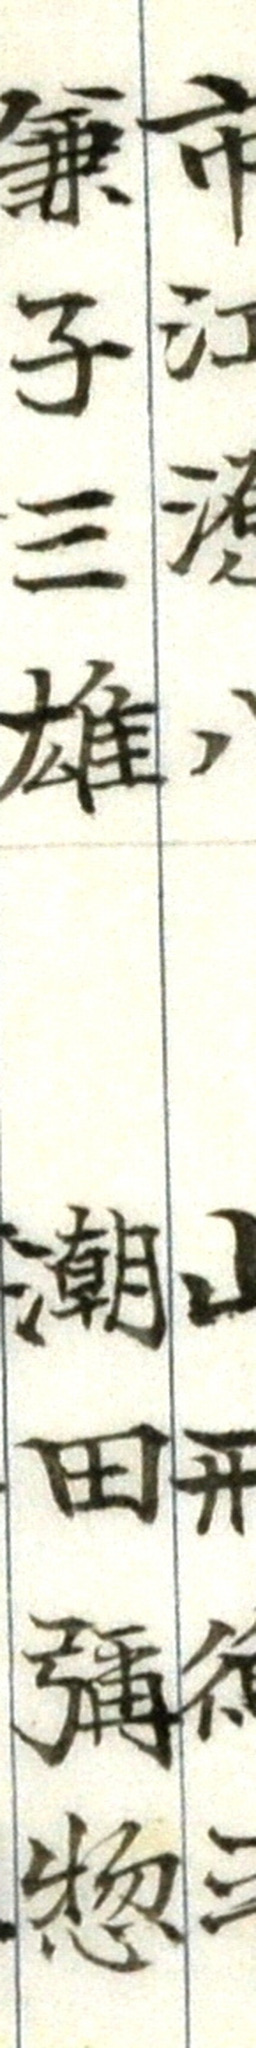兼子三雄潮田弥惣
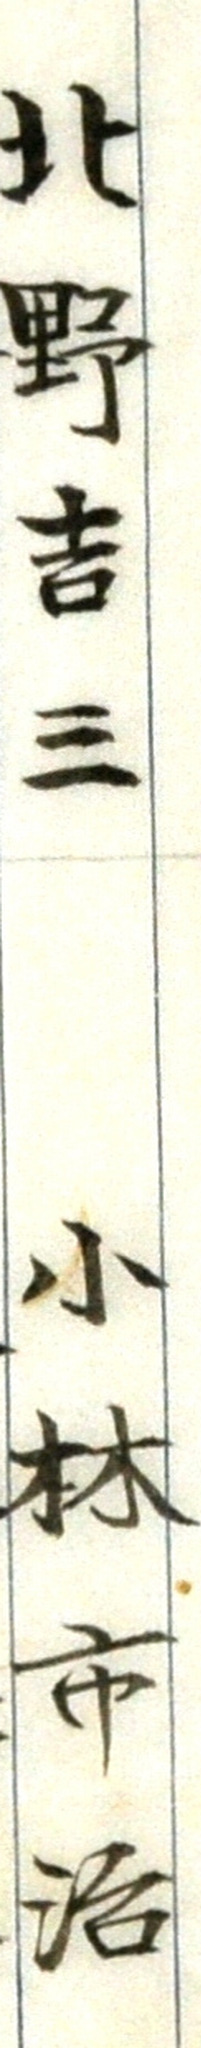北野吉三小林市治
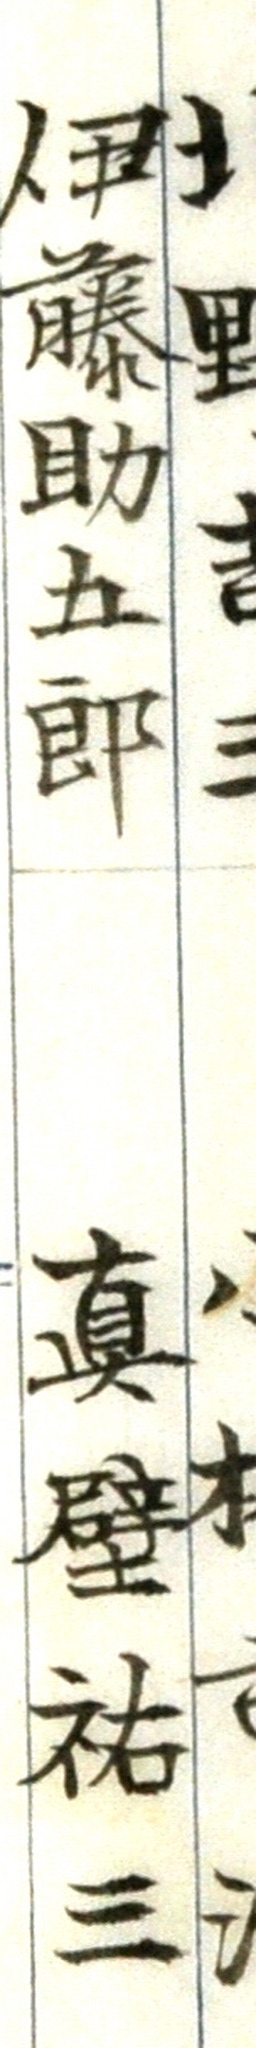伊藤助五郎真壁祐三
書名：高遠藩兵員名簿歩兵銃隊・郷村募集員
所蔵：伊那市立高遠町図書館・合同会社AMANE
